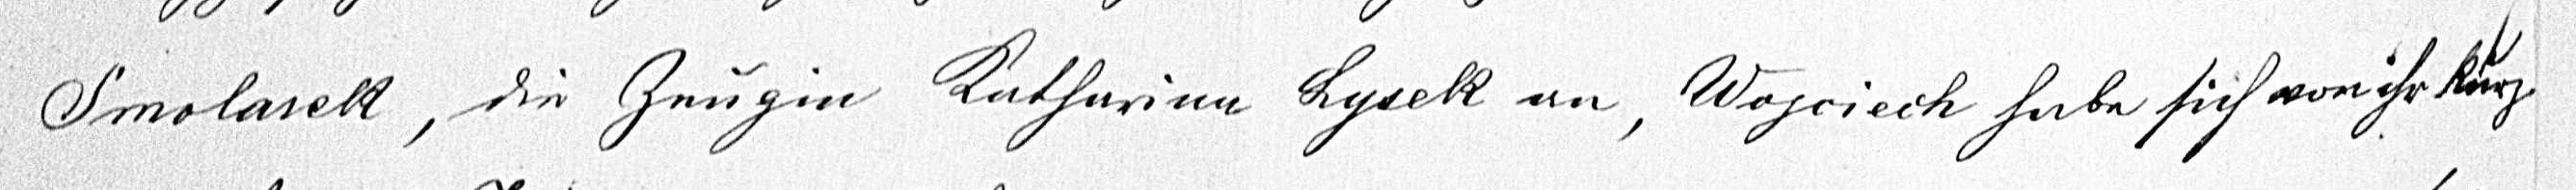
Smolarek, die Zeugin Katharina Lysek an, Wojciech habe sich von ihr kurz
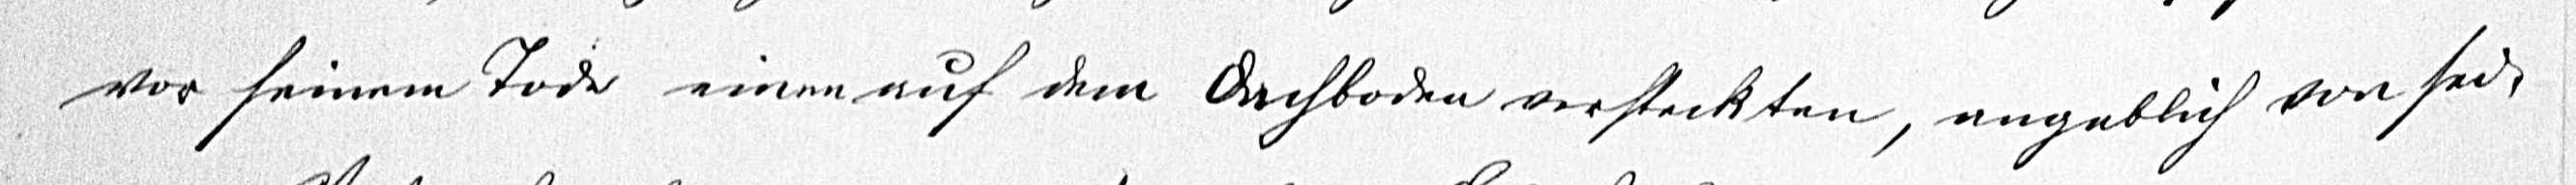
vor seinem Tode einem auf dem Dachboden versteckten, angeblich von sei¬
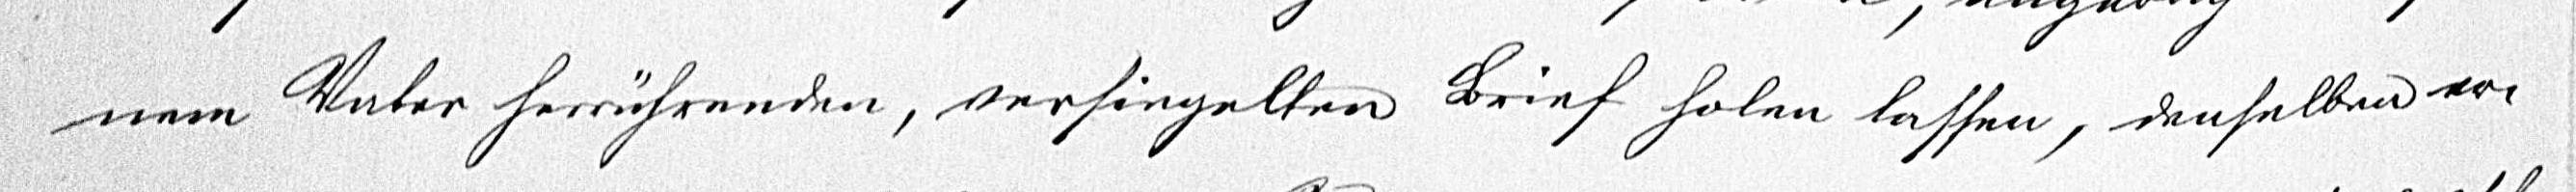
nem Vater herrührenden, versiegelten Brief holen lassen, denselben er¬
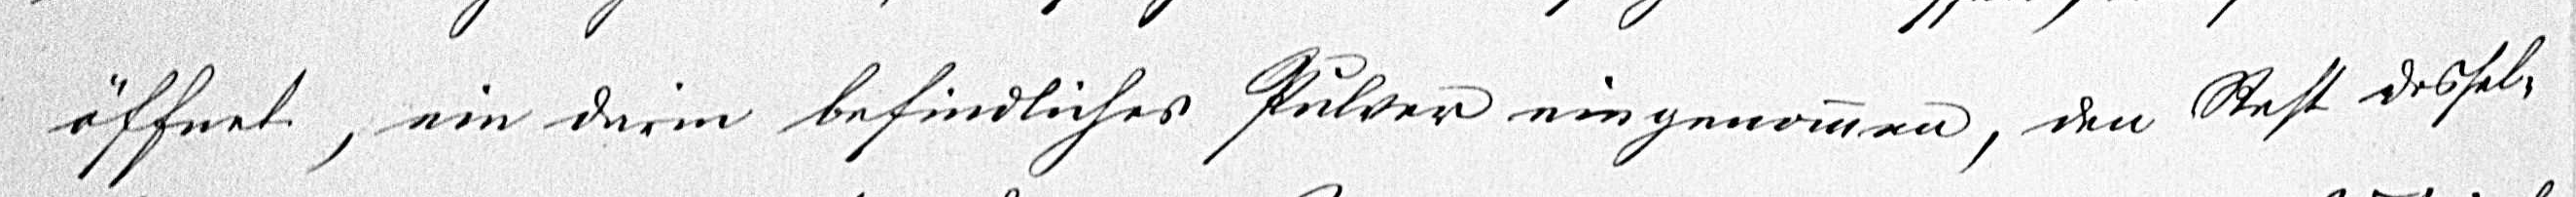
öffnet, ein darin befindliches Pulver eingenommen, den Rest dessel¬
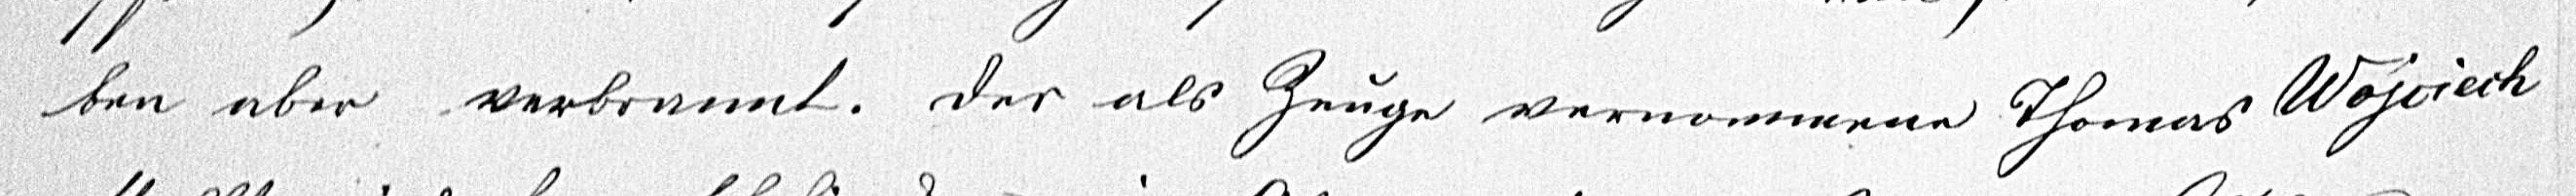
ben aber verbrannt. Der als Zeuge vernommenen Thomas Wojciech
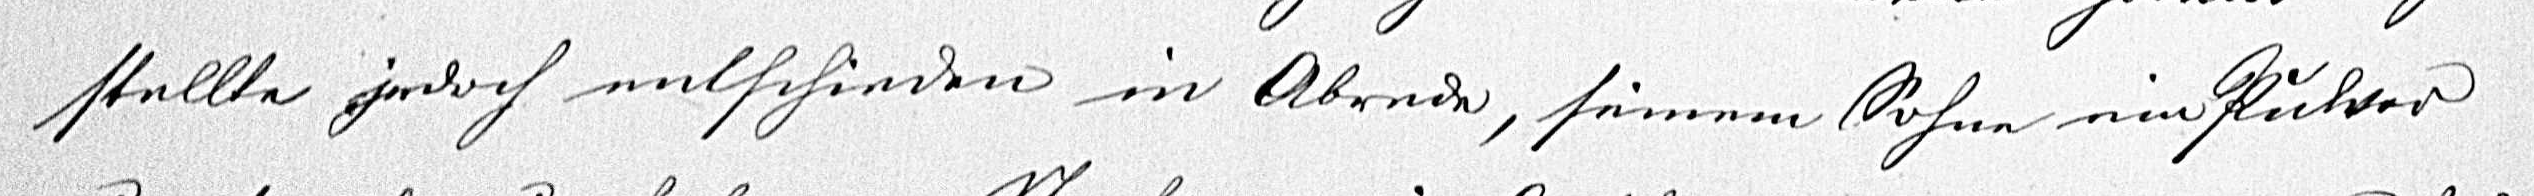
stellte jedoch entschieden in Abrede, seinem Sohne ein Pulver
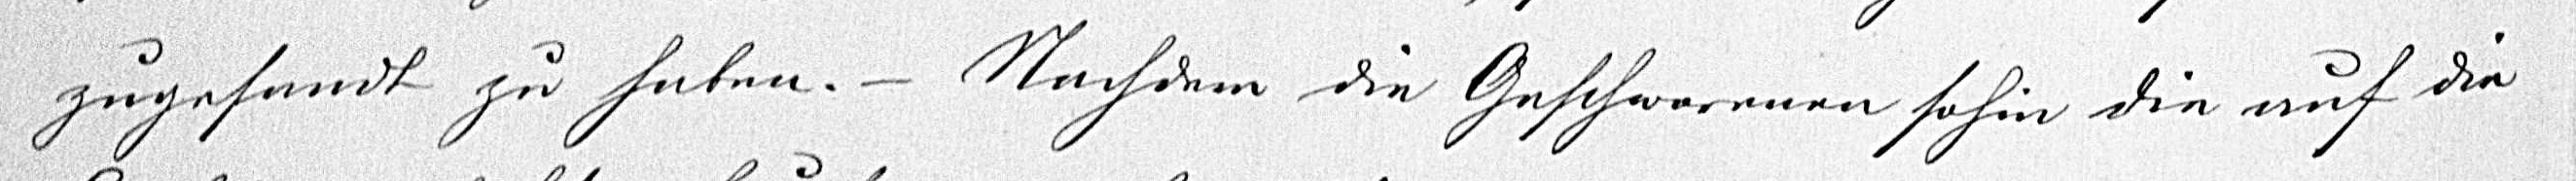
zugesandt zu haben. Nachdem die Geschworenen sohin die auf die
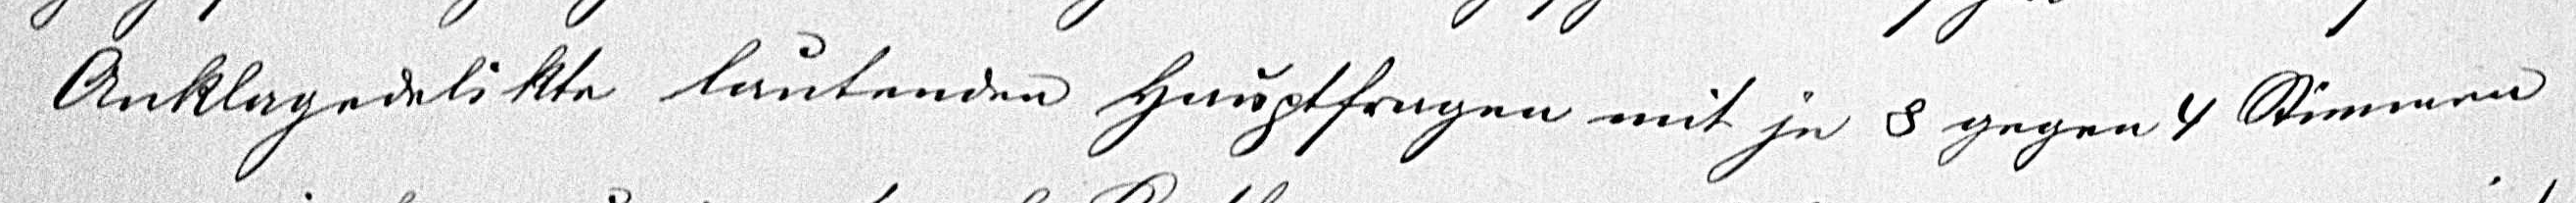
Anklagedelikte lautenden Hauptfragen mit je 8 gegen 4 Stimmen
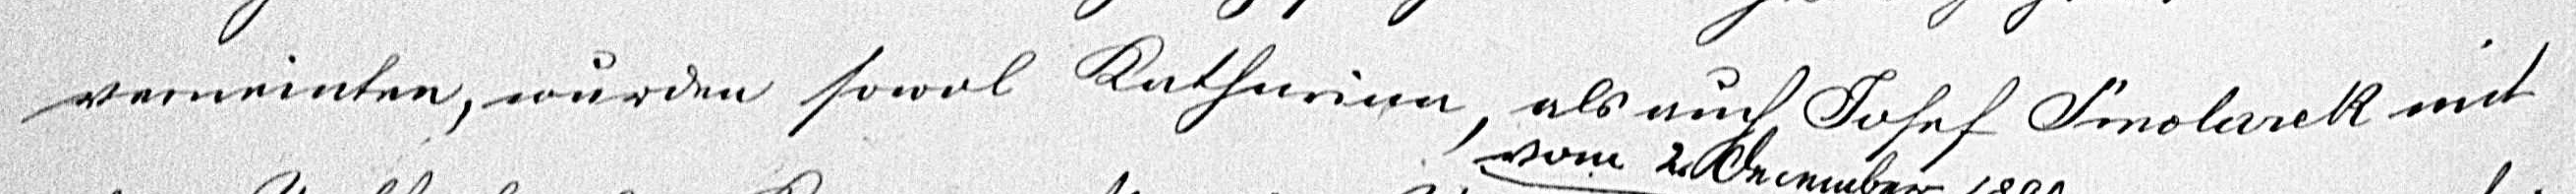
verneinten, wurde sowol Katharina, als auch Josef Smolarek mit
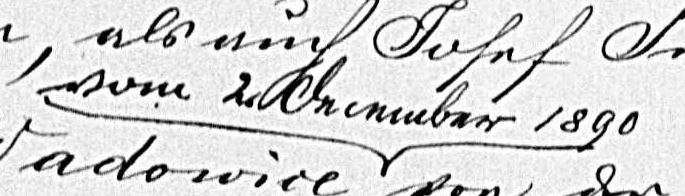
vom 2. December 1890
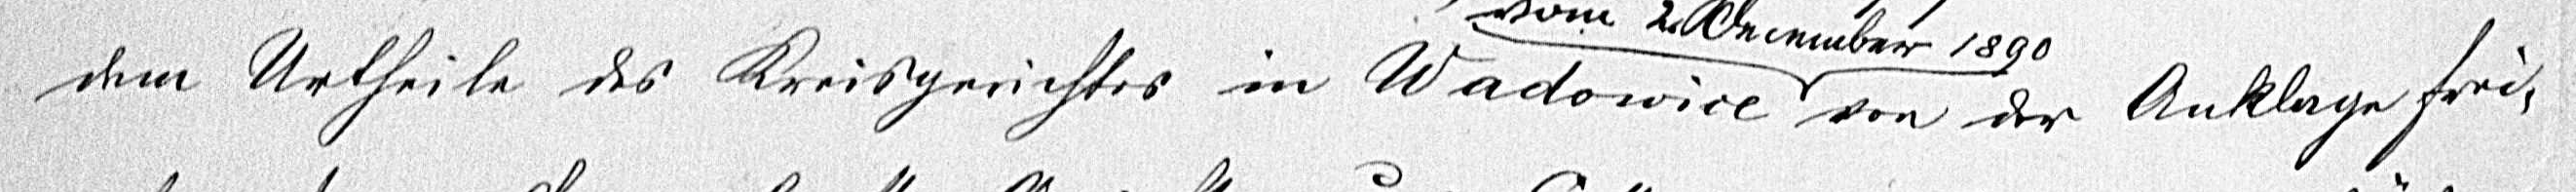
dem Urtheile des Kreisgerichtes in Wadowice von der Anklage frei
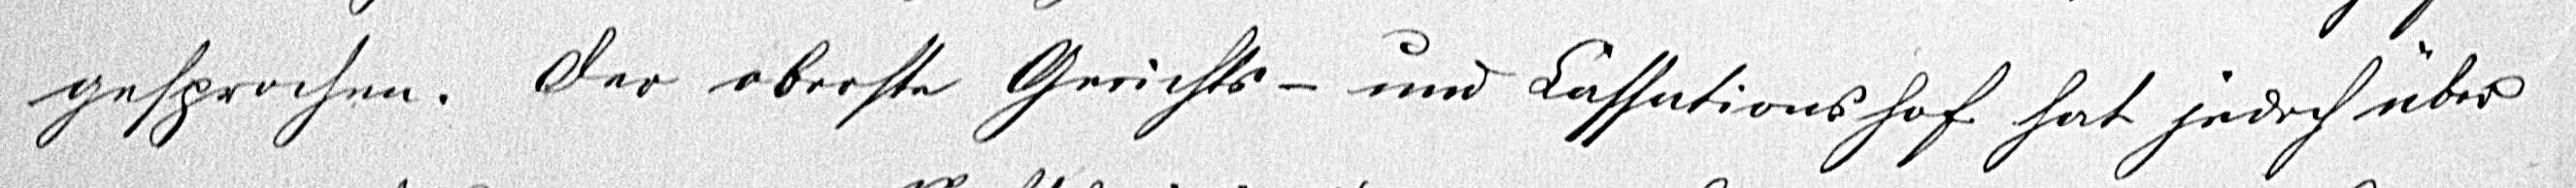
gesprochen. Der oberste Gerichts- und Cassationshof hat jedoch über
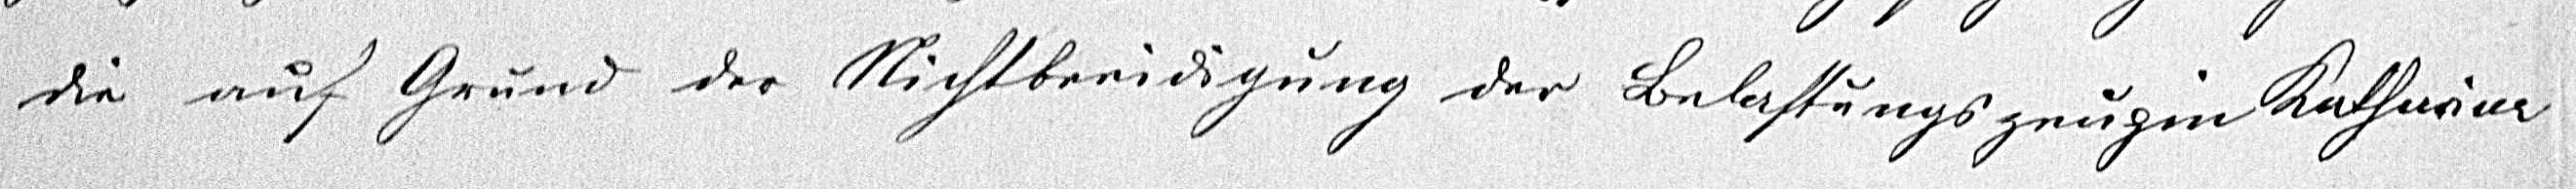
die auf Grund der Nichtbeeidigung der Belastungszeugin Katharina
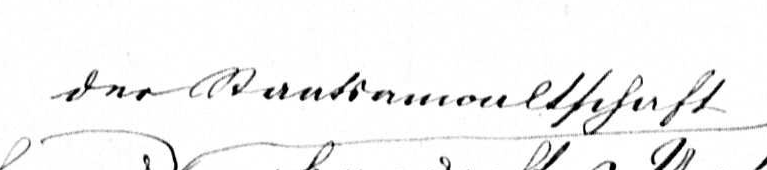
der Staatsanwaltschaft
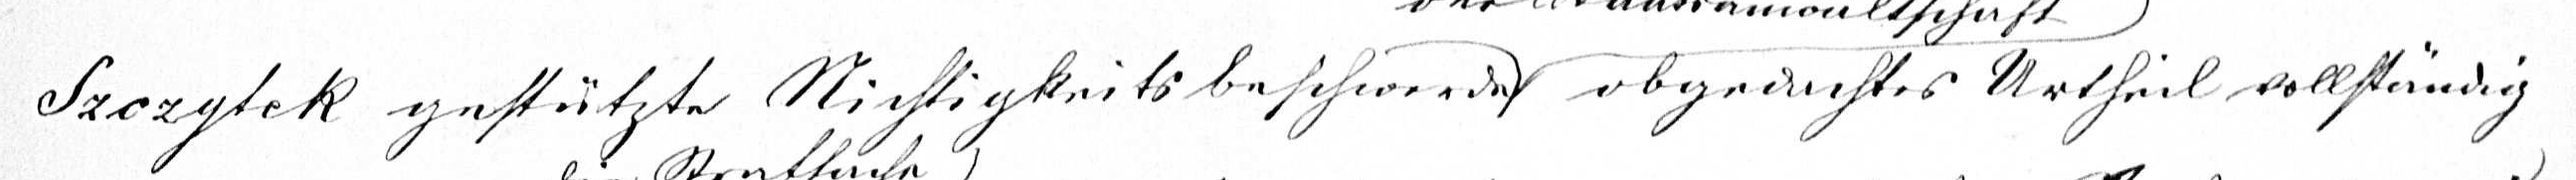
Szczytek gestützte Nichtigkeitsbeschwerde obgeanhtes Urtheil vollständig
